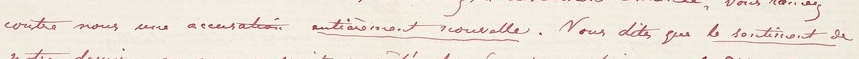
contre nous une accusation entièrement nouvelle. Vous dites que le sentiment de
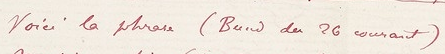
Voici la phrase (Bund du 26 courant)
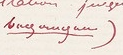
begangen)
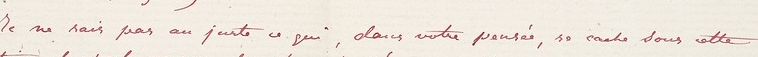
Je ne sais pas au juste ce qui, dans votre pensée, se cache sous cette
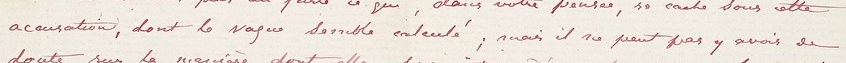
accusation, dont le vague semble calculé; mais il ne peut pas y avoir de
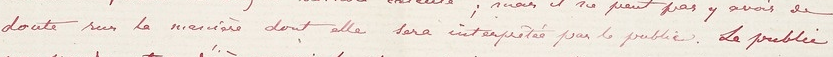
doute sur la manière dont elle sera interprêtée par le public. Le public
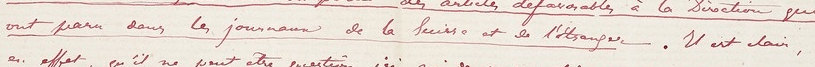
ont paru dans les journaux de la Suisse et de l'étranger. Il est clair,
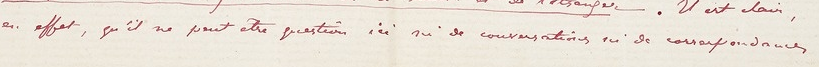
en effet, qu'il ne peut être question ici ni de conversations ni de correspondances
